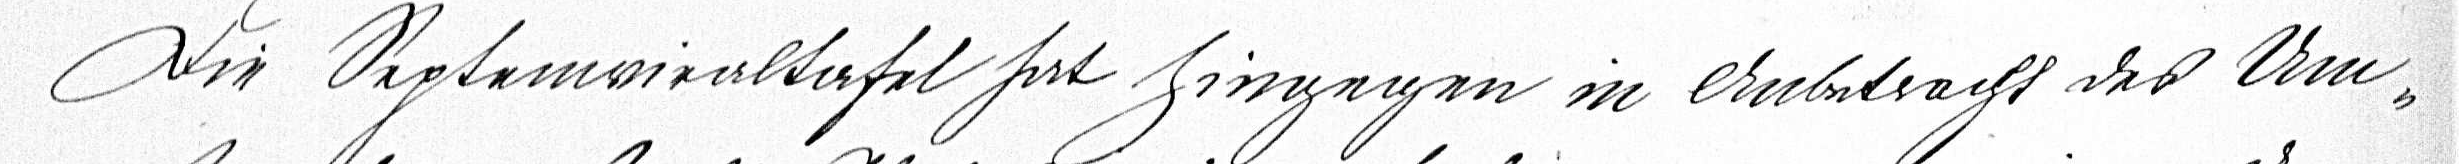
Die Septemviraltafel hat hingegen in Anbetracht des Um¬
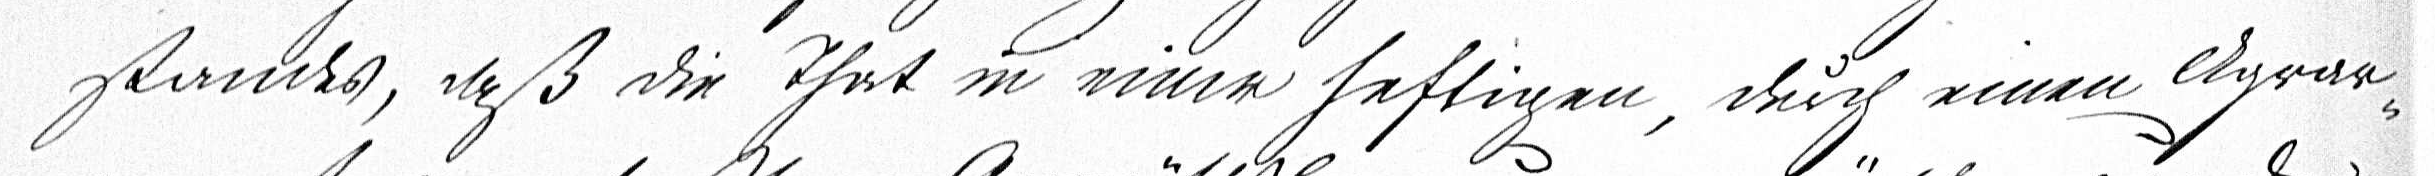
standes, daß die That in einer heftigen, durch einen Agrar¬
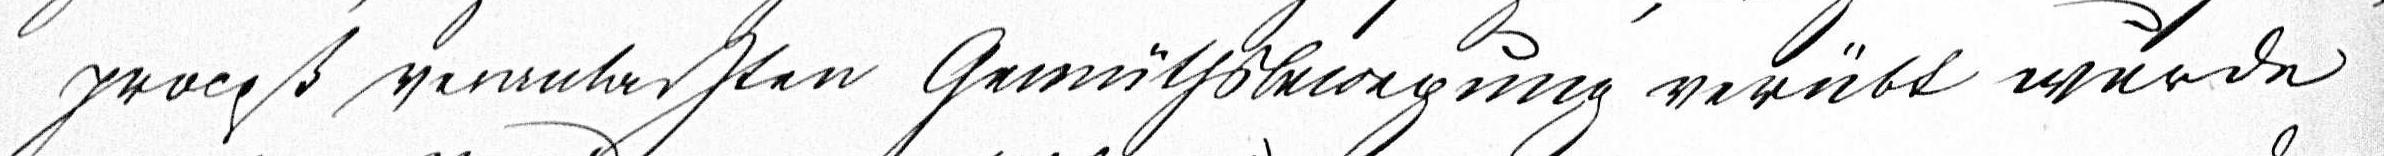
proceß veranlaßten Gemüthsbewegung verübt wurde
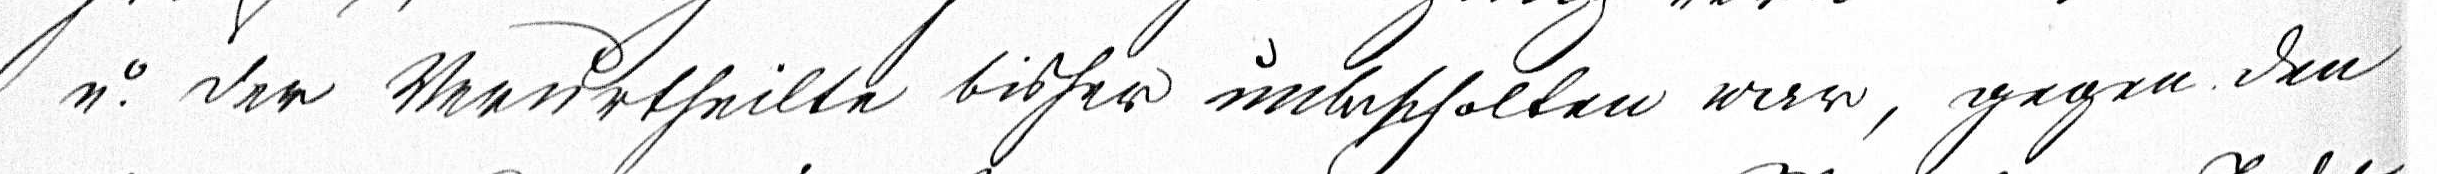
u. der Verurtheilte bisher unbescholten war, gegen den
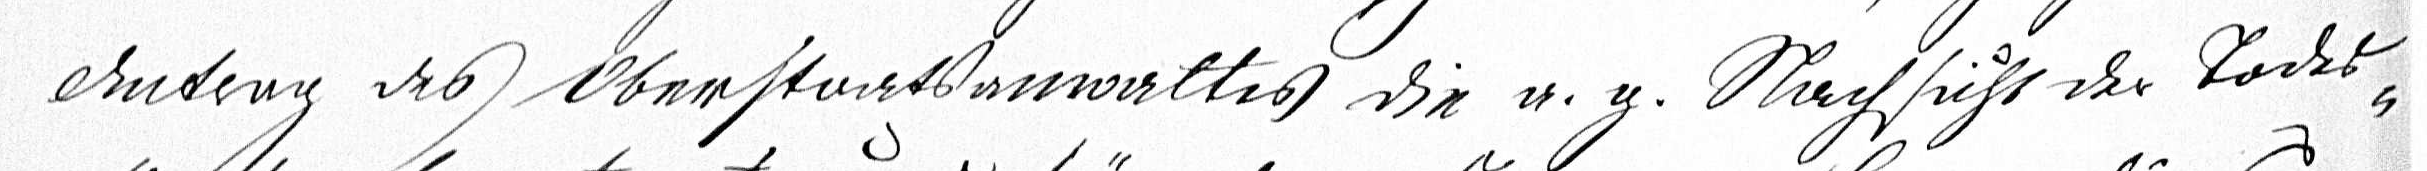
Antrag des Oberstaatsanwaltes die a.g. Nachsicht der Todes¬
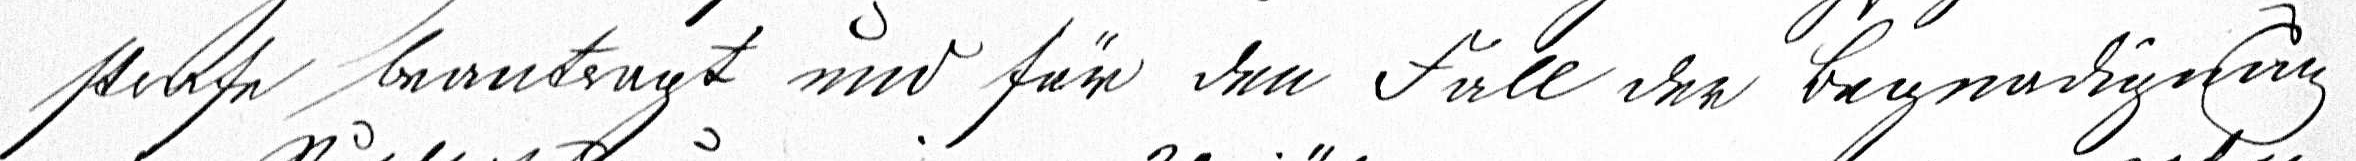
strafe beantragt und für den Fall der Begnadigung
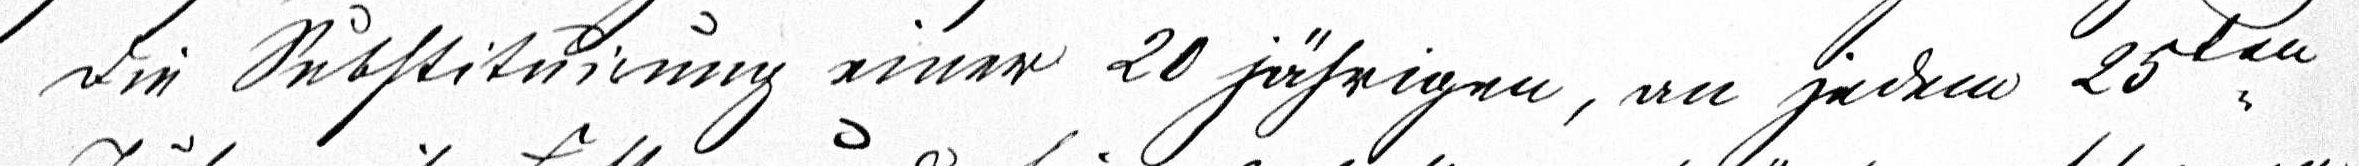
die Substituirung einer 20jährigen, an jedem 25ten
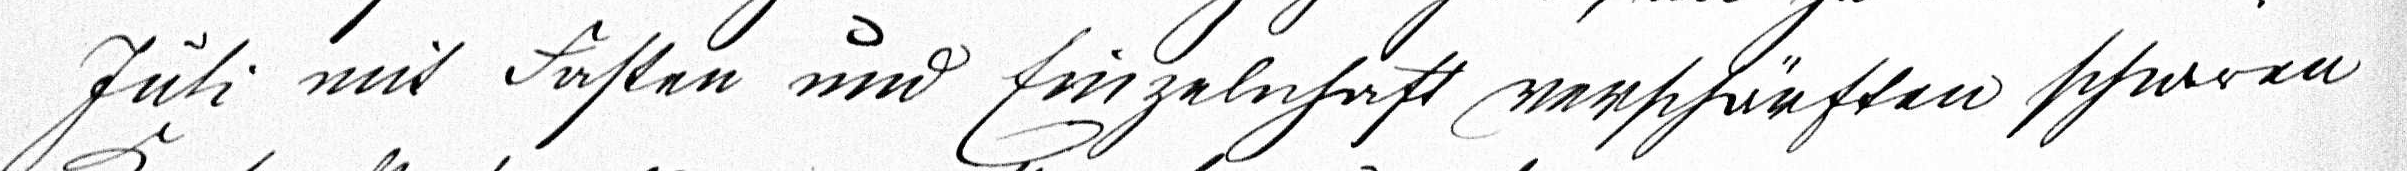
Juli Fasten und Einzelnhaft verschärften schweren
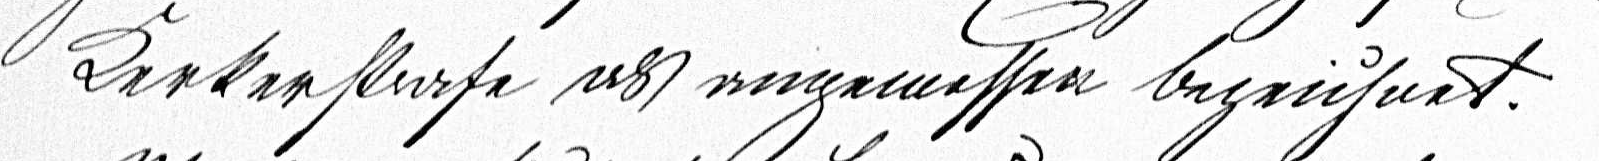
Kerkerstrafe als angemessen bezeichnet.
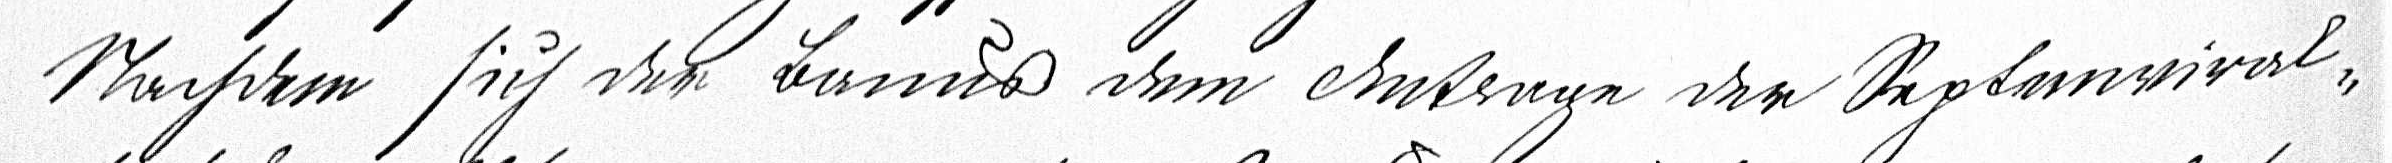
Nachdem sich der Banus dem Antrage der Septemviral¬
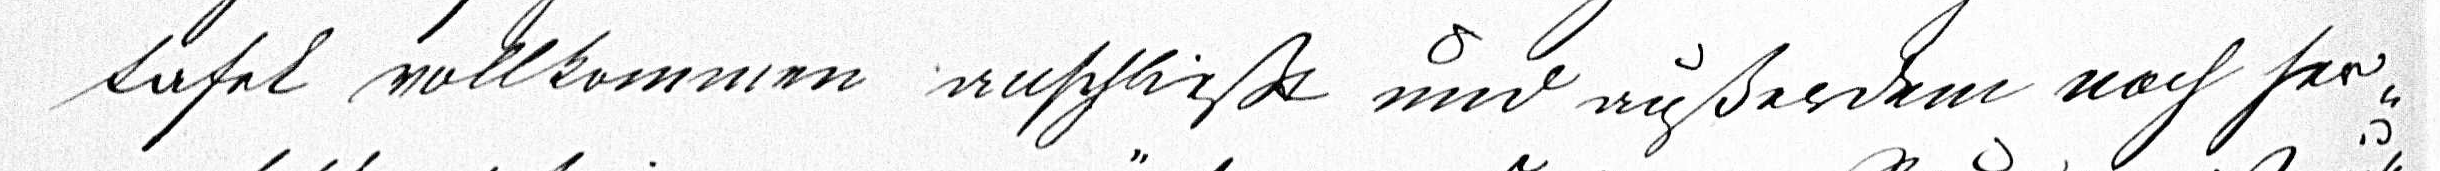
tafel vollkommen anschließt und außerdem noch her¬
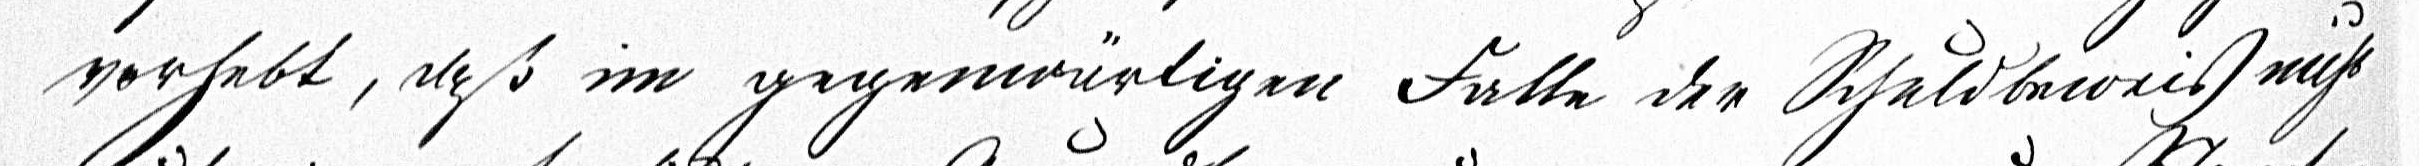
vorhebt, daß im gegenwärtigen Falle der Schuldbeweis nicht
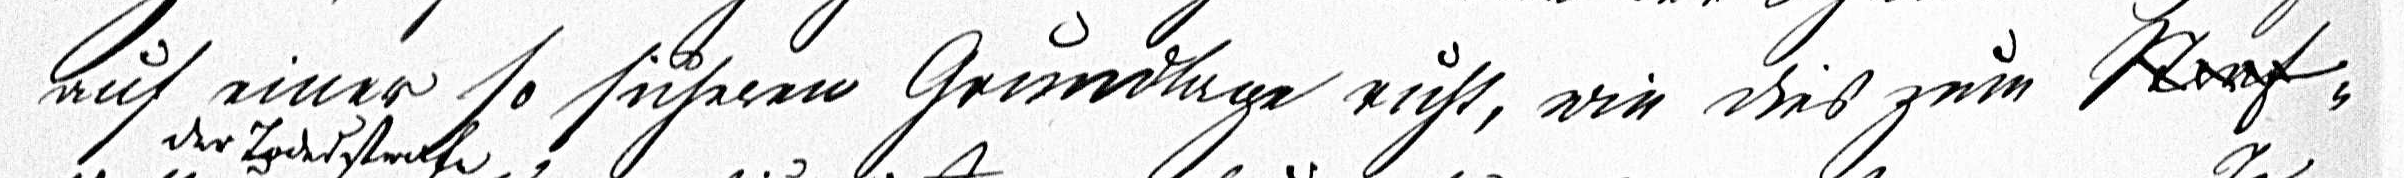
auf einer so sicheren Grundlage ruht, wie dies zum
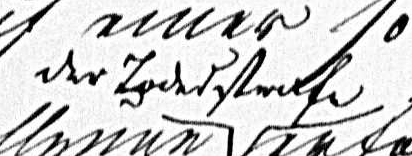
der Todesstrafe
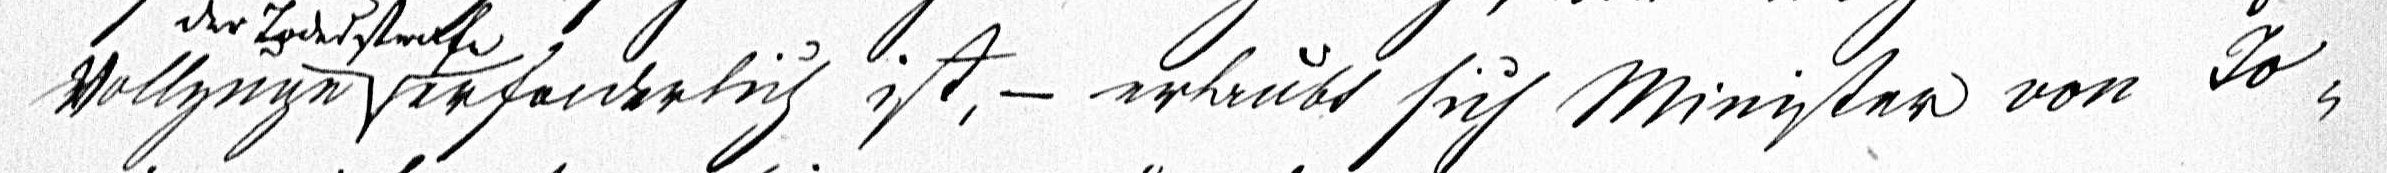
Vollzuge erforderlich ist, -- erlaubt sich Minister von Jo¬
